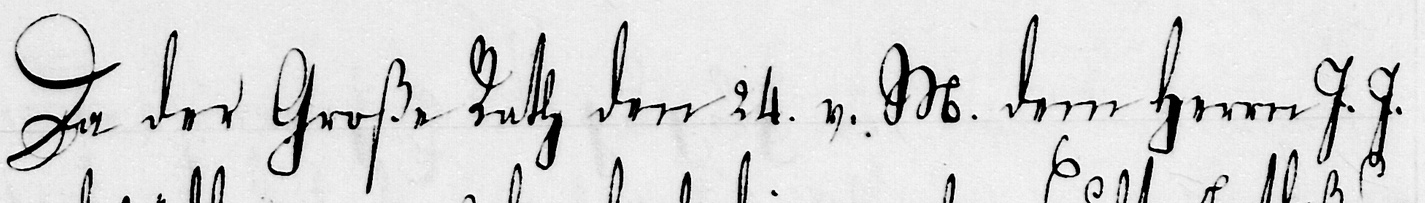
Da der Große Rath den 24. v. M. dem Herrn J.
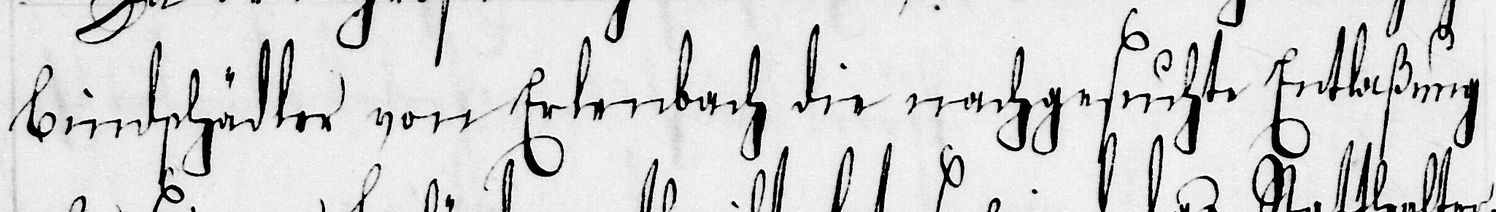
Bindschädler von Erlenbach die nachgesuchte Entlaßung
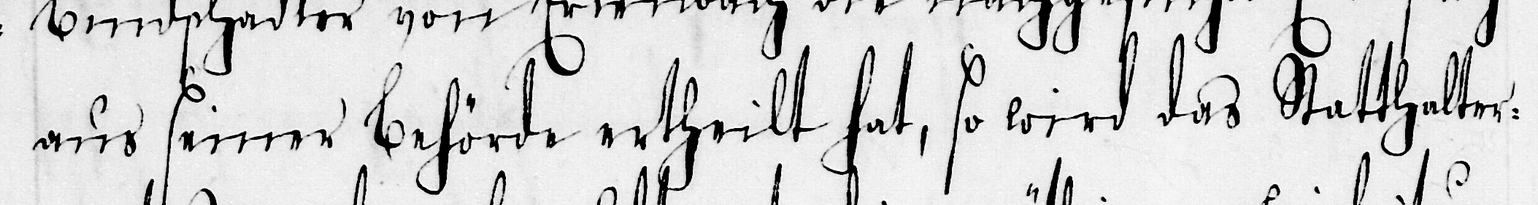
aus seiner Behörde ertheilt hat, so wird das Statthalte¬
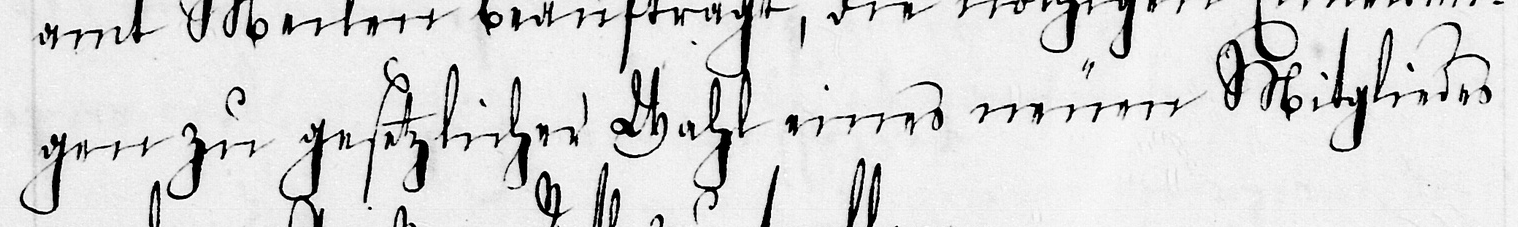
gen zu gesetzlicher Wahl eines neuen Mitgliedes
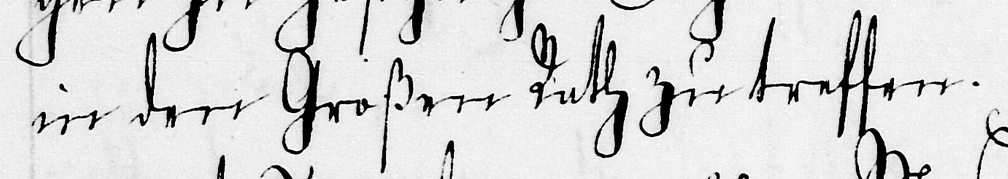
in den Großen Rath zu treffen.
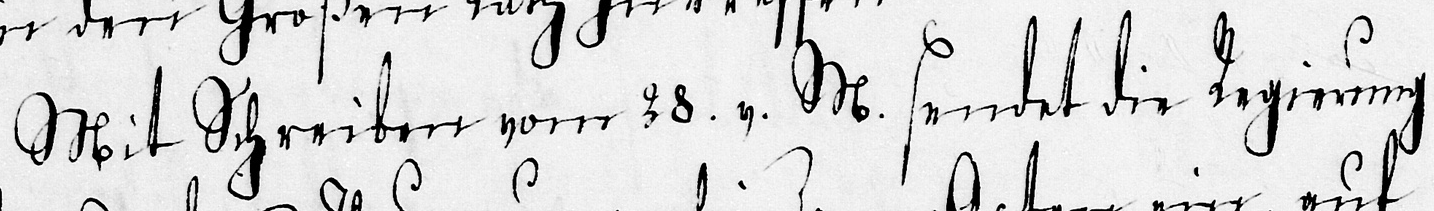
Mit Schreiben vom 28. v. M. sendet die Regierung
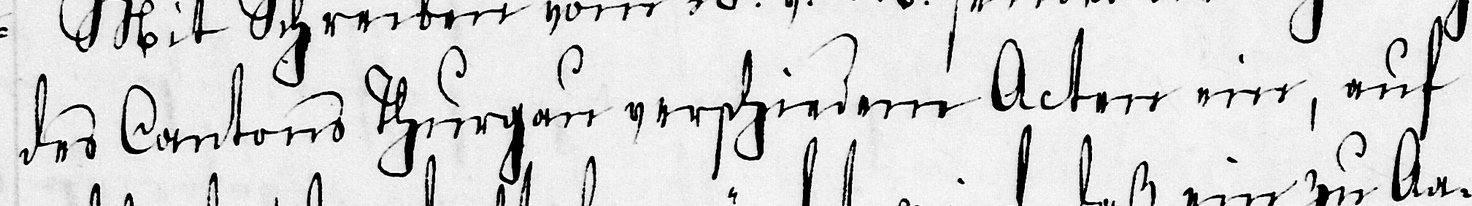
des Cantons Thurgau verschiedene Acten ein, auf
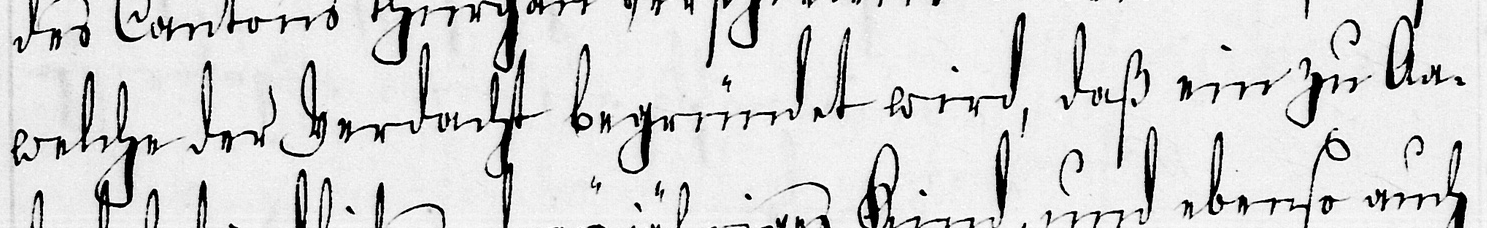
welche der Verdacht begründet wird, daß ein zu Aa¬
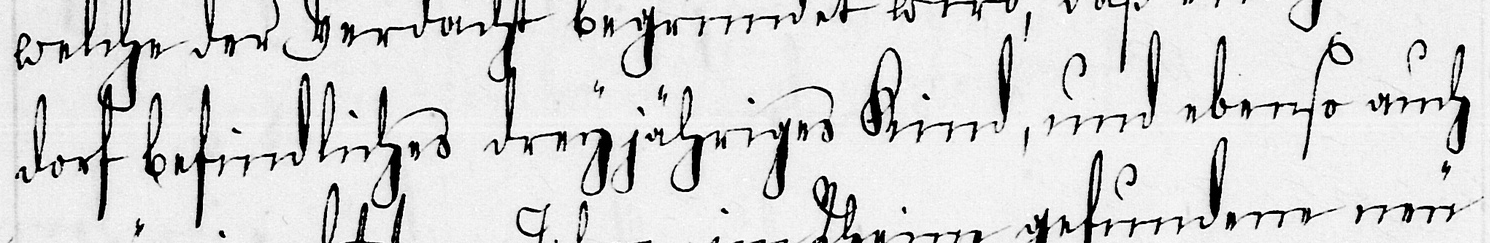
dorf befindliches dreyjähriges Kind, und ebenso auch
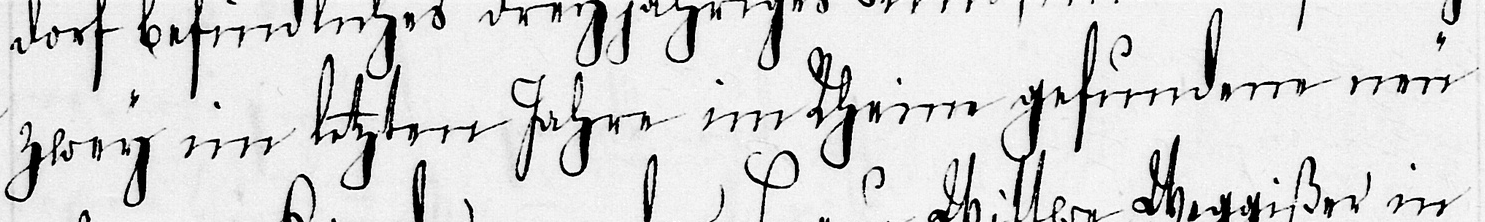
zwey im letzten Jahre im Rheine gefundene neu
